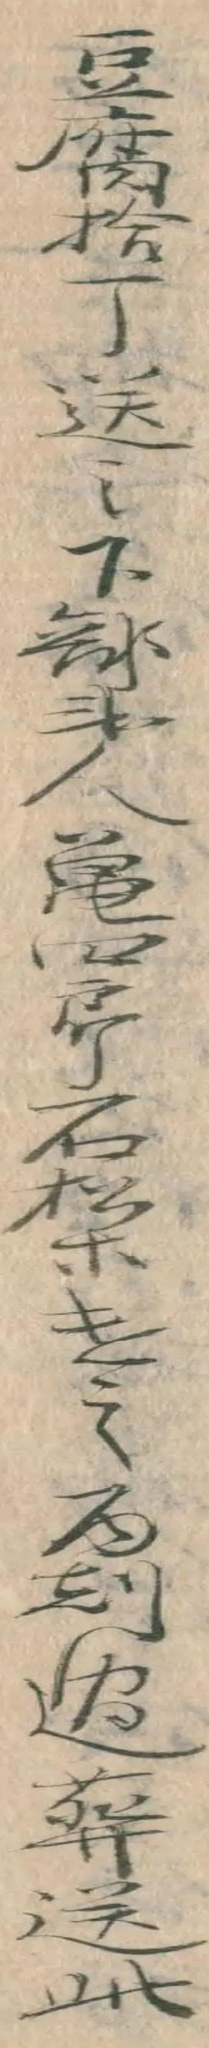豆腐拾丁送之下部弐人亀四郎石松等遣之酉刻過葬送此
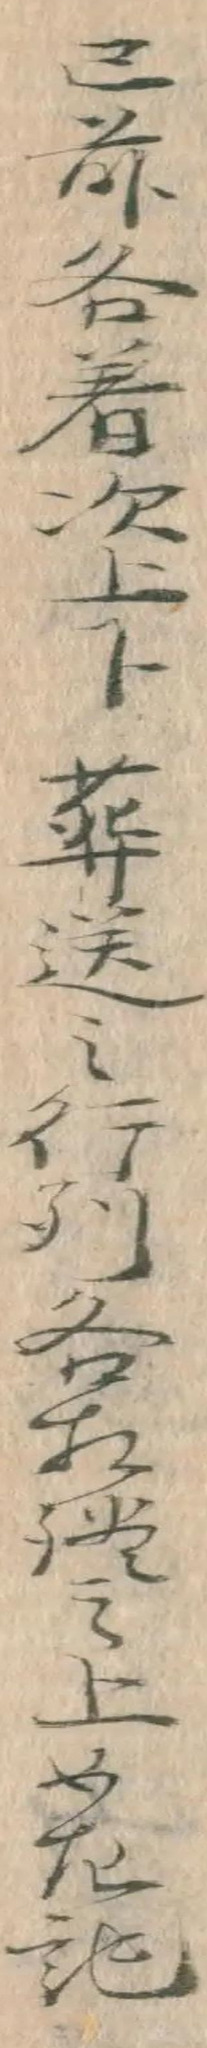已前各着次上下葬送之行列各相談之上如左記
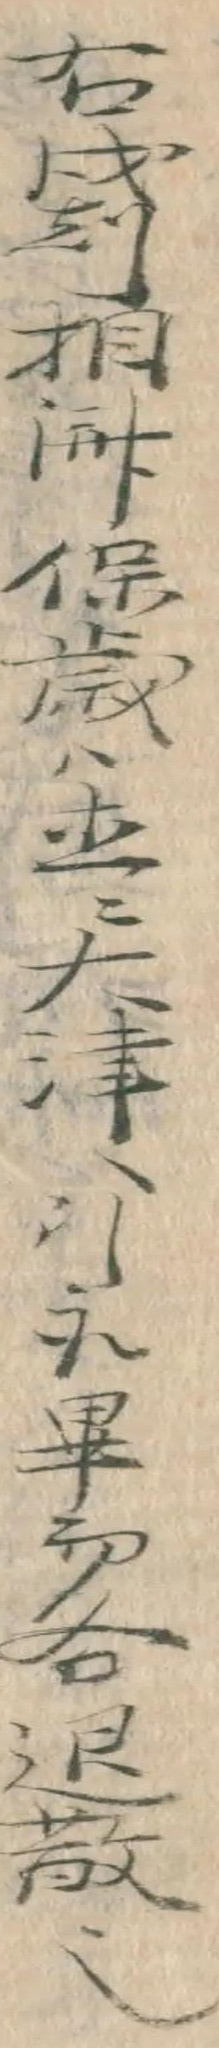右戌刻相州保歳ハ直二大津へ引取畢而各退散之
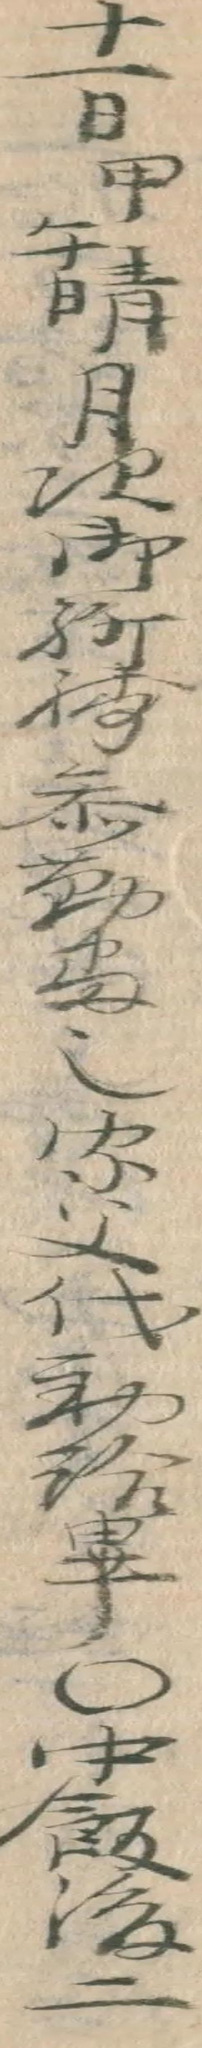十一日甲午晴月次御祈祷参勤番也家父代勤給畢○中飯後二
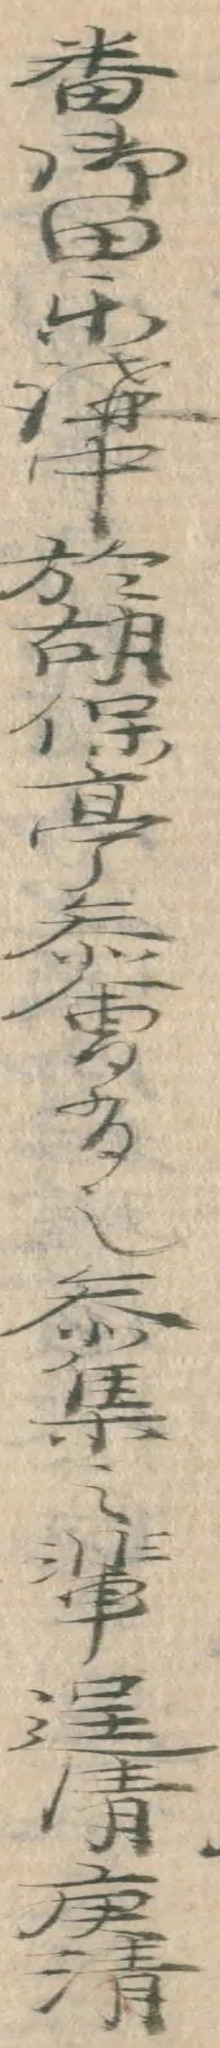番御田楽講中於胡保亭参會有之参集之輩逞清庚清
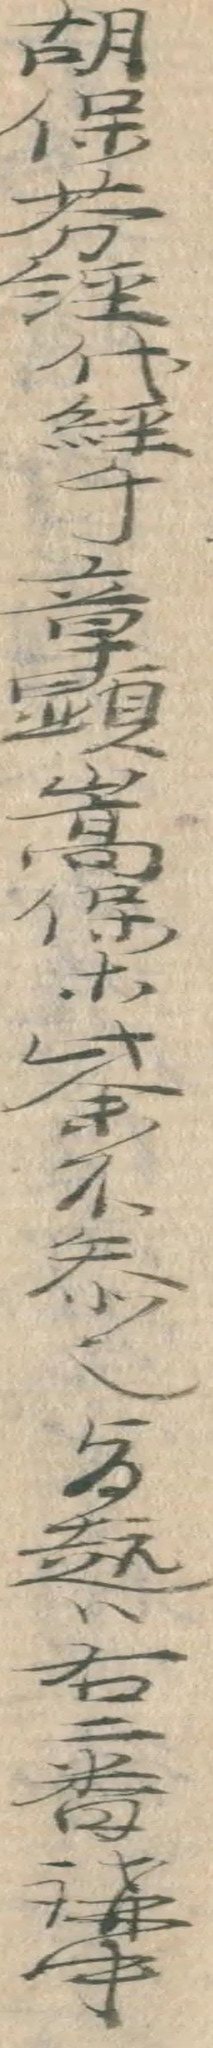胡保芬経代経千章顕嵩保等此余不参也旨趣ハ右二番講中
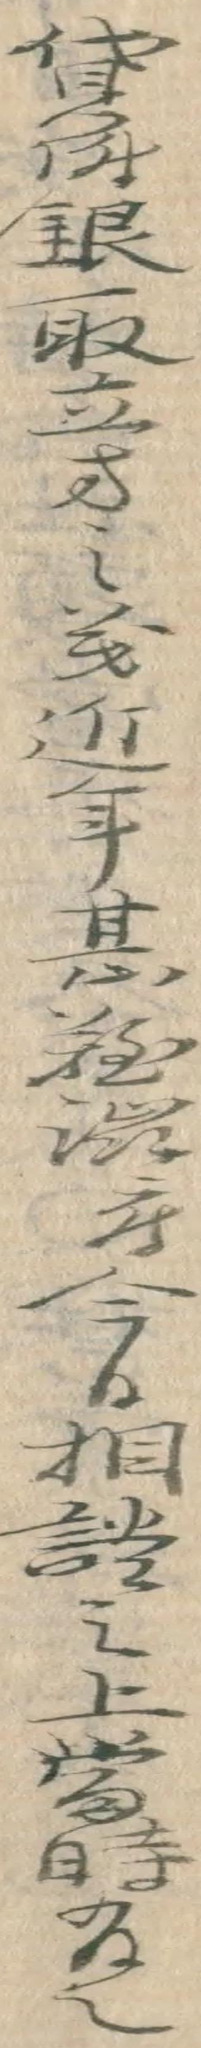貸附銀取立方之義近年甚難渋ニ付今日相談之上當時有之
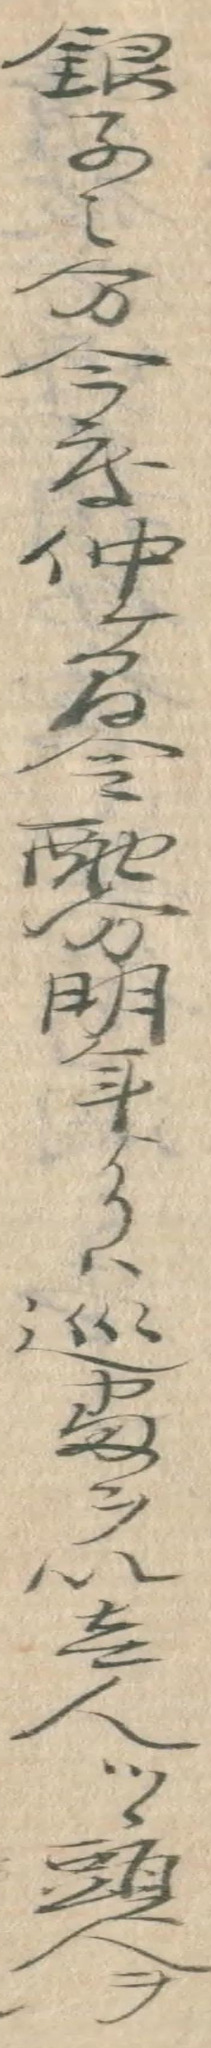銀子之分今度仲ヶ間配分明年よりハ巡番ヲ以壱人ツヽ頭人ヲ
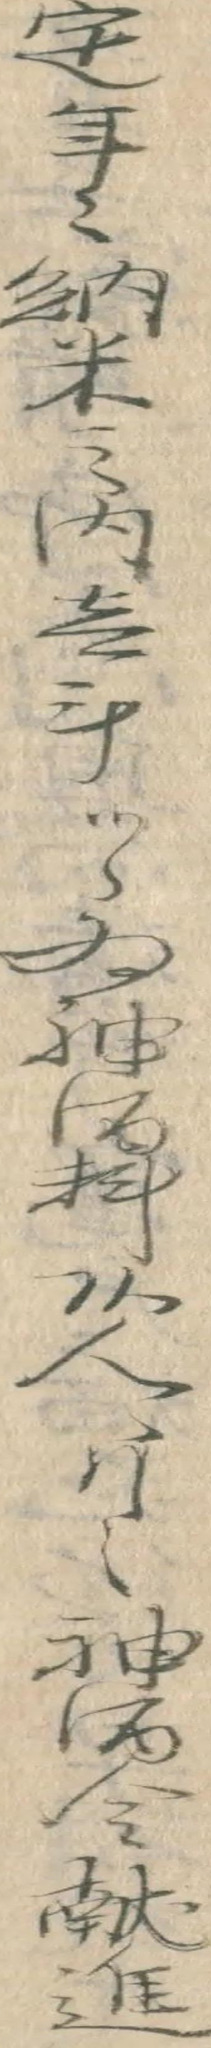定年々納米之内壱斗ツゝ為神酒料頭人に引之神酒令献進
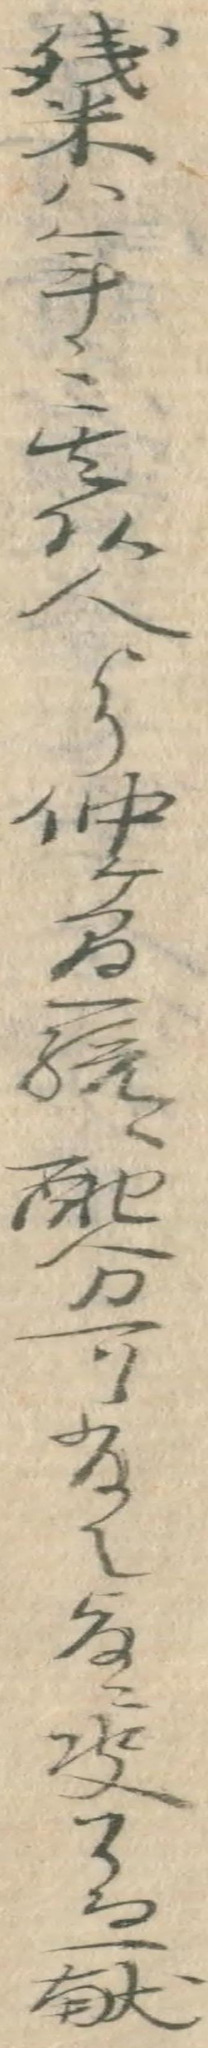残米ハ年々其頭人より仲ケ間一統へ配分可有之旨ニ決了而一献
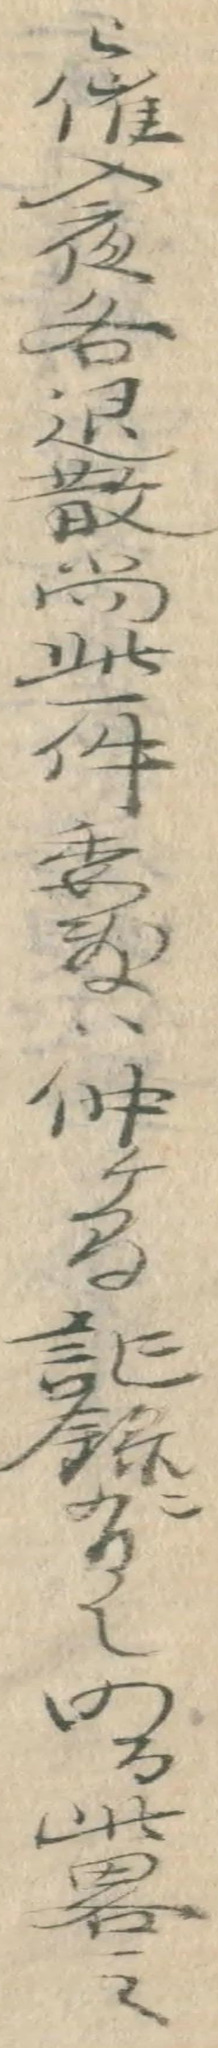被催入夜各退散尚此一件委敷ハ仲ヶ間記録有之仍而此畧之

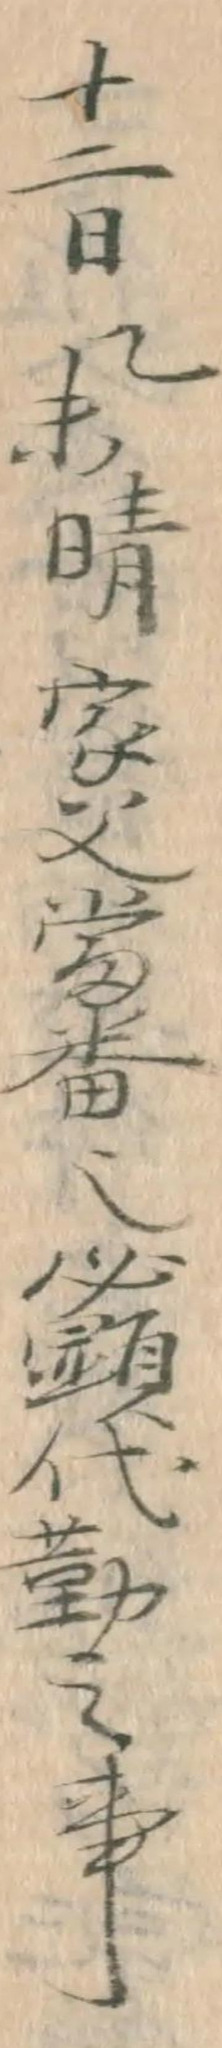十二日乙未晴家父當番也必顕代勤之事
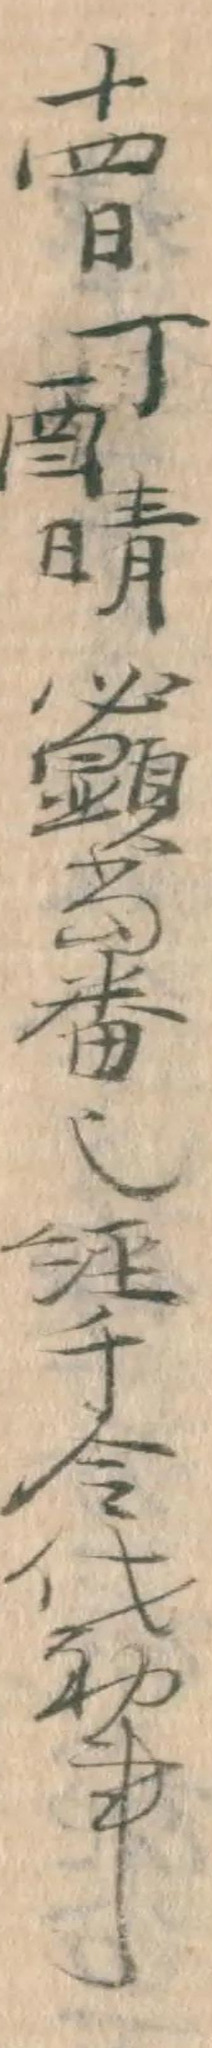十四日丁酉晴必顕當番也経千令代勤事
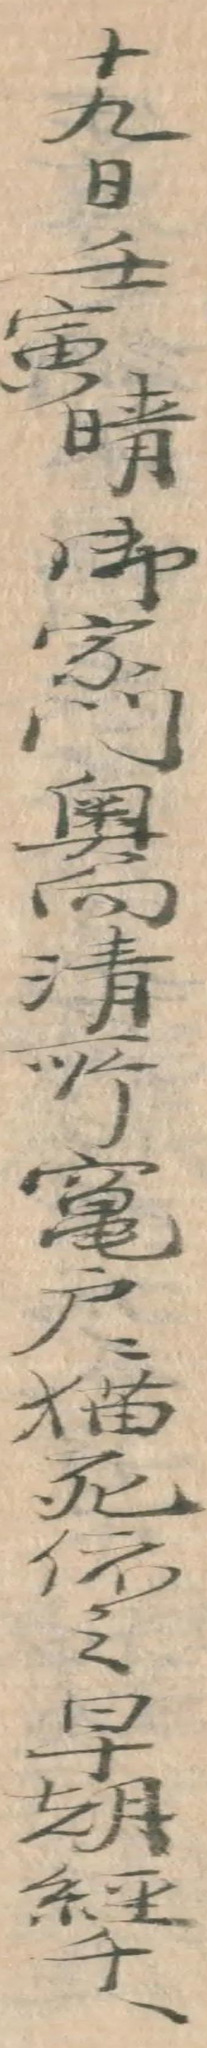十九日壬寅晴御家門奥向清所竃戸ニ猫死依之早朝経千へ
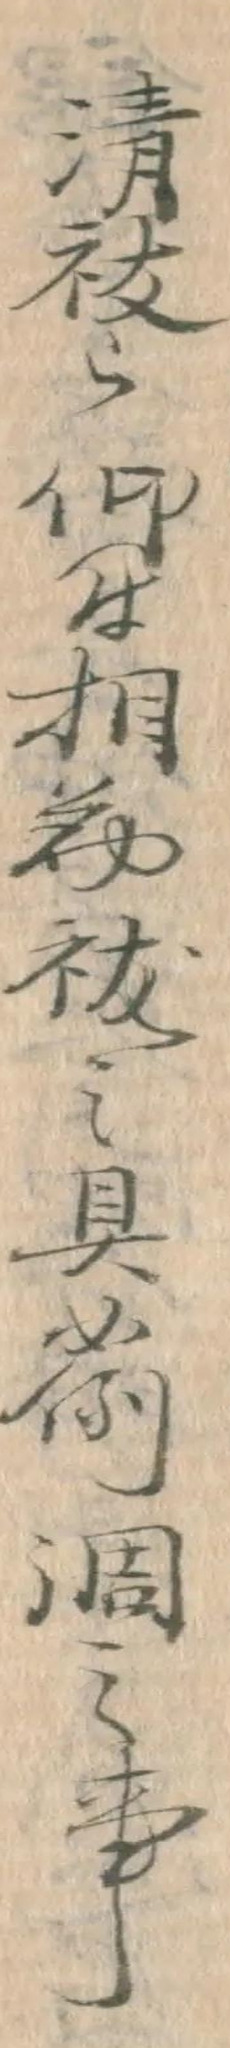清祓被仰付相勤祓之具如例調之事
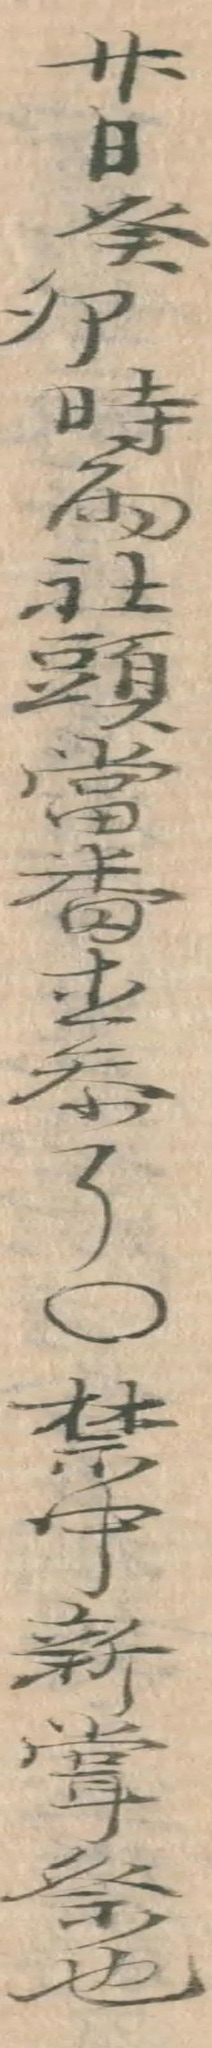廿日癸卯時雨社頭當番直参了○禁中新嘗祭也
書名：賀茂社記録. 第65冊
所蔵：国立国会図書館 National Diet Library, JAPAN
